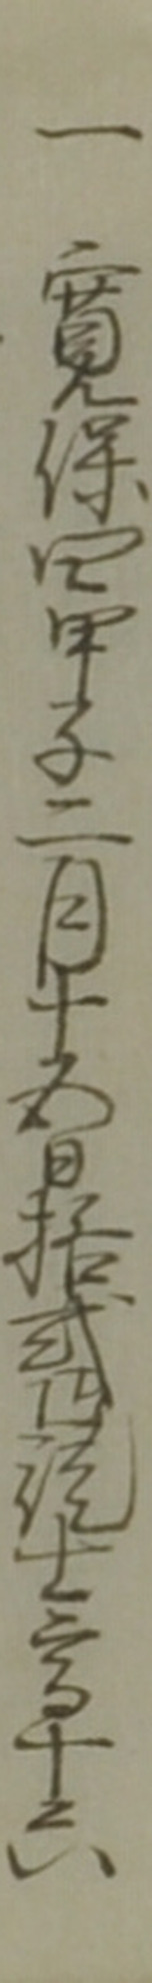一寛保四甲子二月十五日格式御徒士高十六
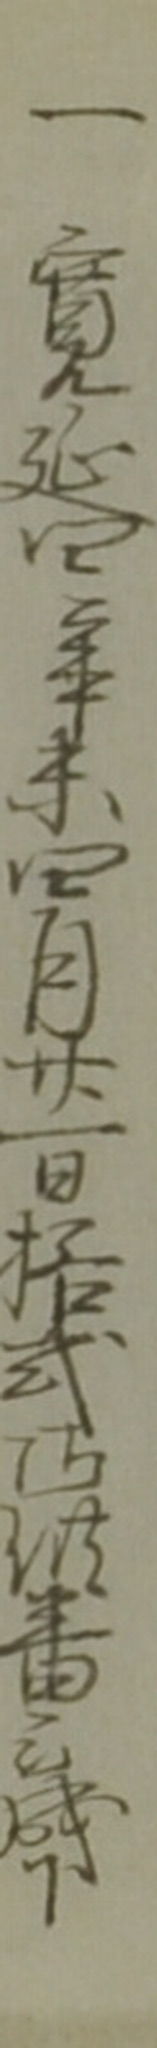一寛延四辛未四月廿一日格式御供番被成下
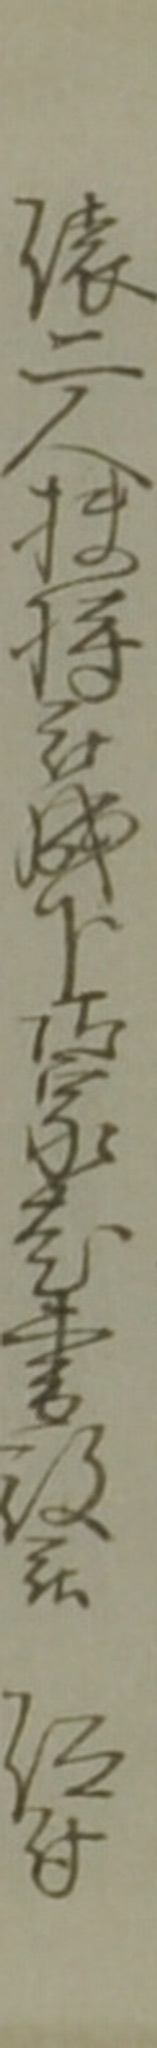俵二人扶持被成下御家老書役被仰付
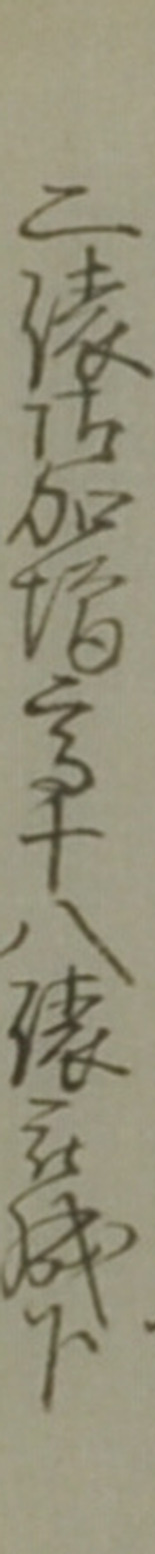二俵御加増高十八俵被成下
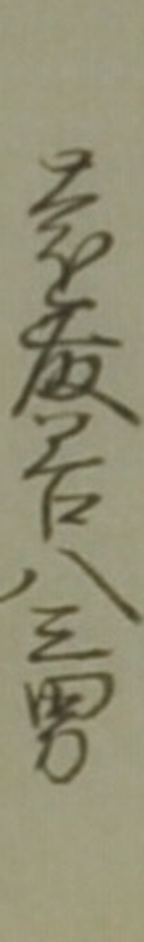遠藤善八三男
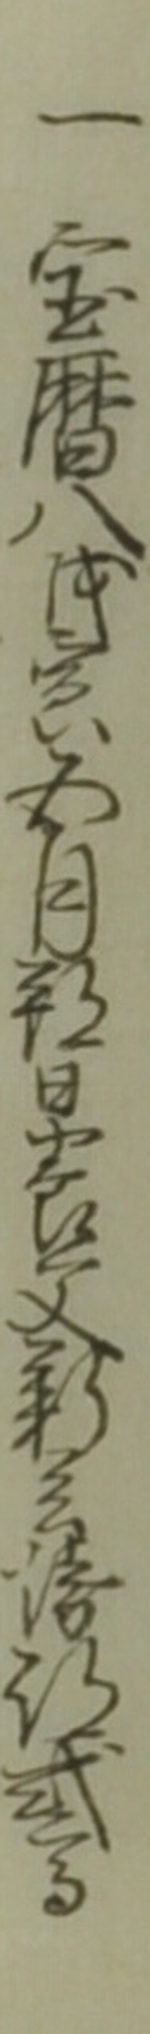一宝暦八戊寅五月朔日養父新兵衛跡式高
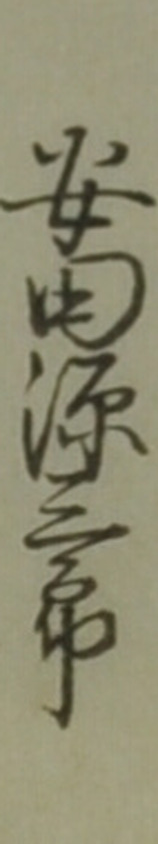安田源三郎
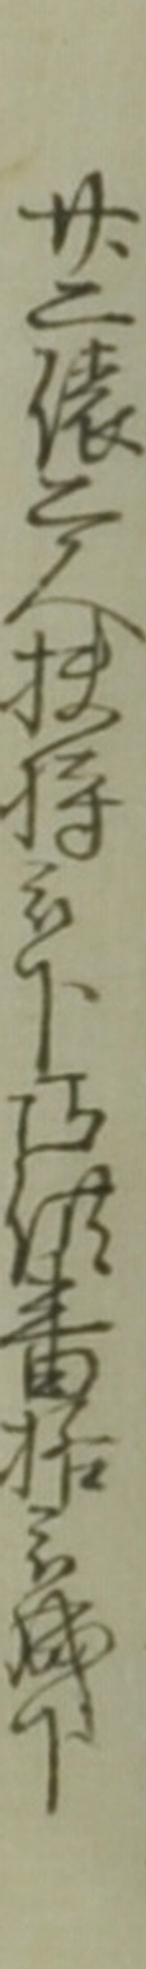廿二俵二人扶持被下御供番格被成下

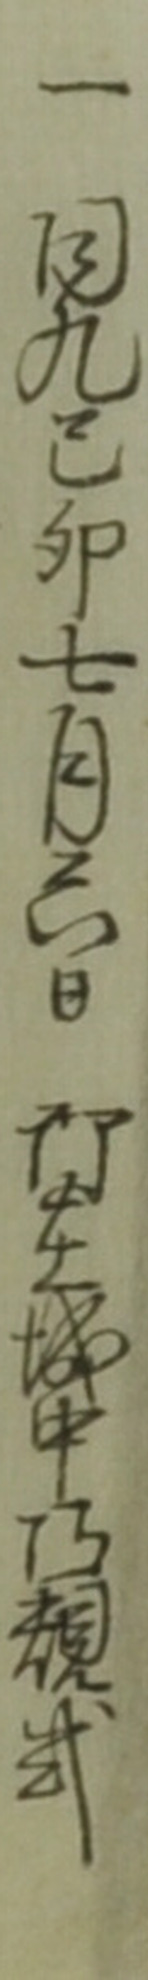一同九己卯七月六日御在城中御規式
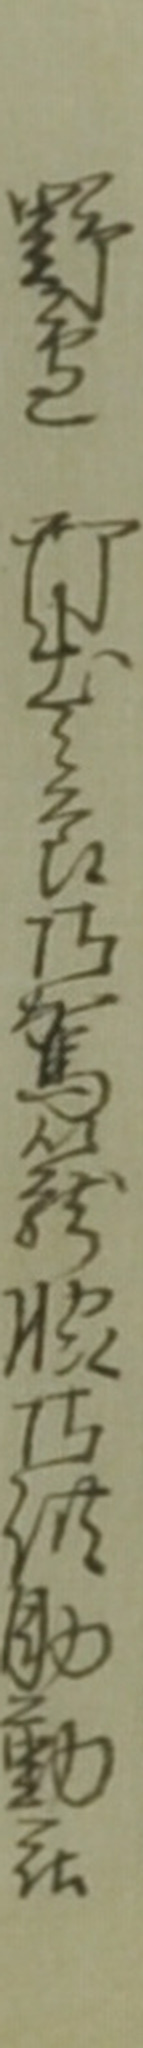野辺御出之節御駕籠脇御供助勤被
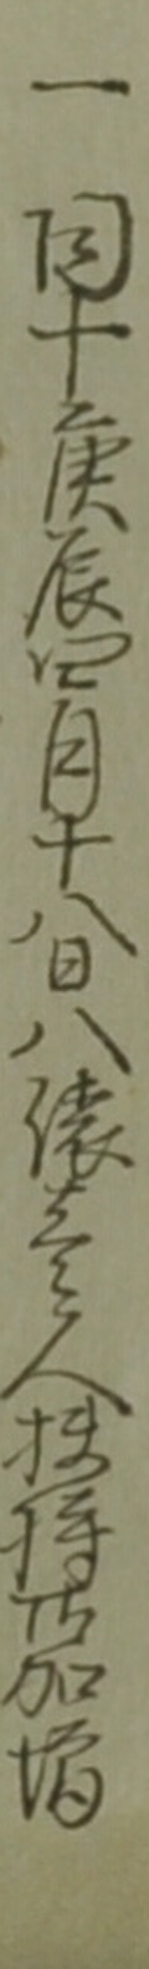一同十庚辰四月十八日八俵壱人扶持御加増
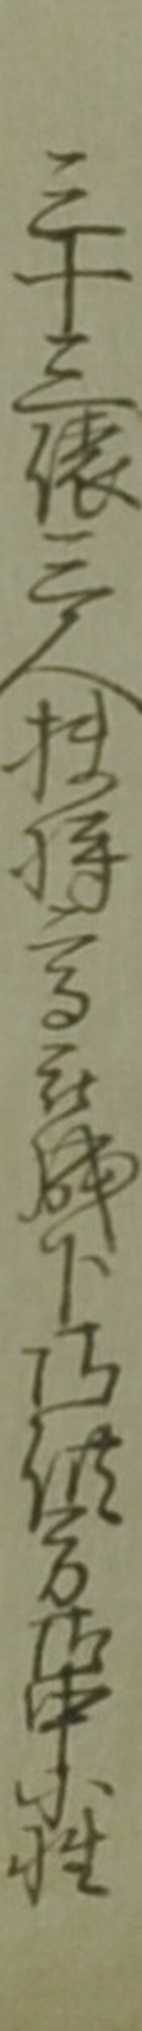三十三俵三人扶持高被成下御供方御中小性
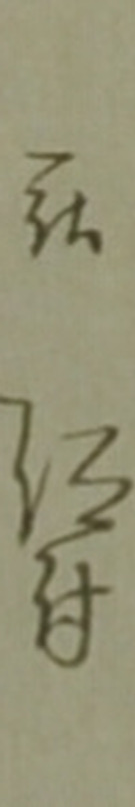被仰付
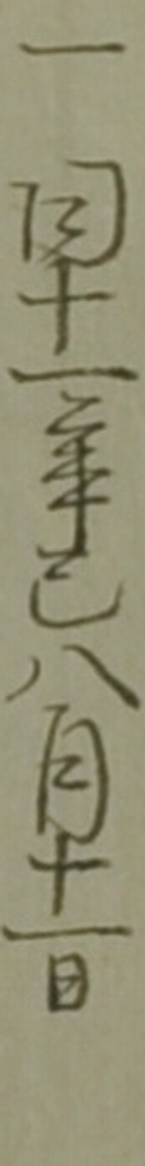一同十一年巳八月十一日
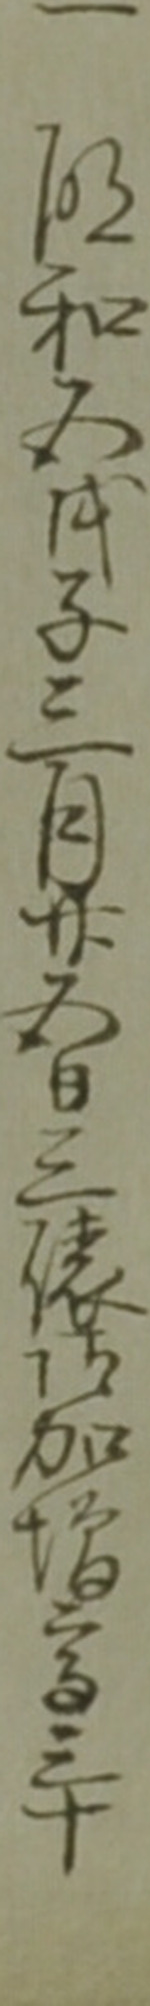一明和五戊子三月廿五日三俵御加増高三十
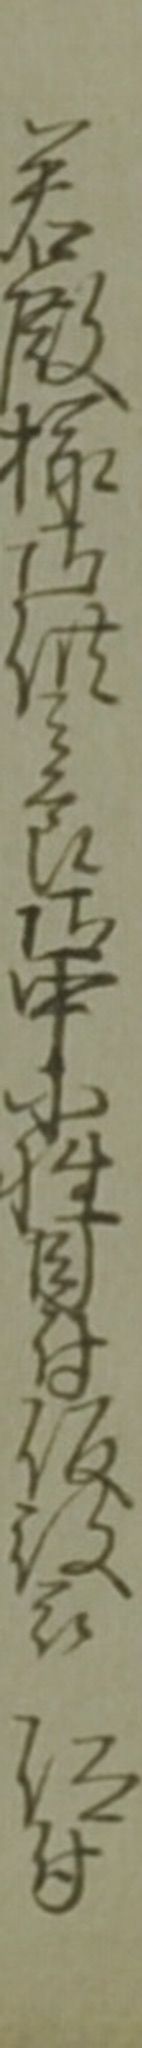若殿様御供之節御中小性目付仮役被仰付
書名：無足諸士勤仕録（一）
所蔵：伊那市立高遠町図書館・合同会社AMANE
